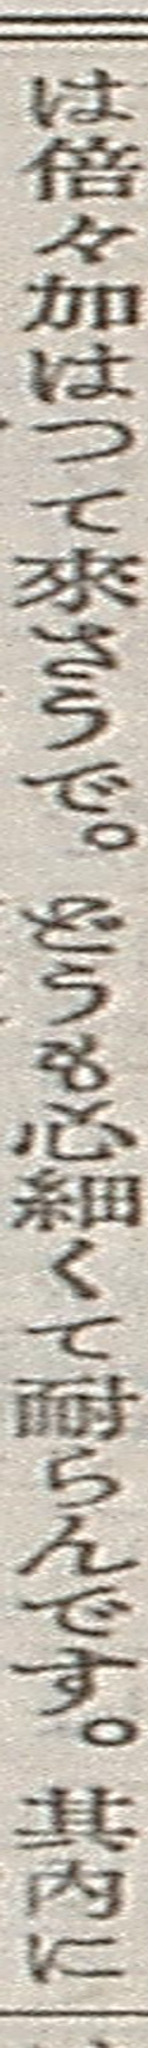は倍々加はつて来さうで。どうも心細くて耐らんです。其内に
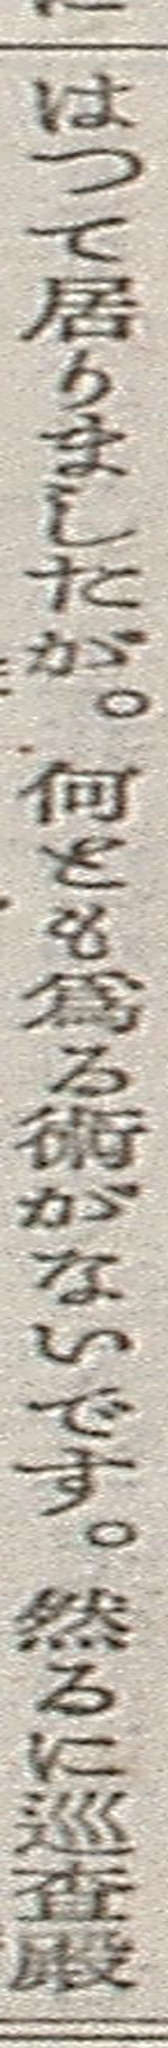はつて居りましたが。何とも為る術がないです。然るに巡査殿
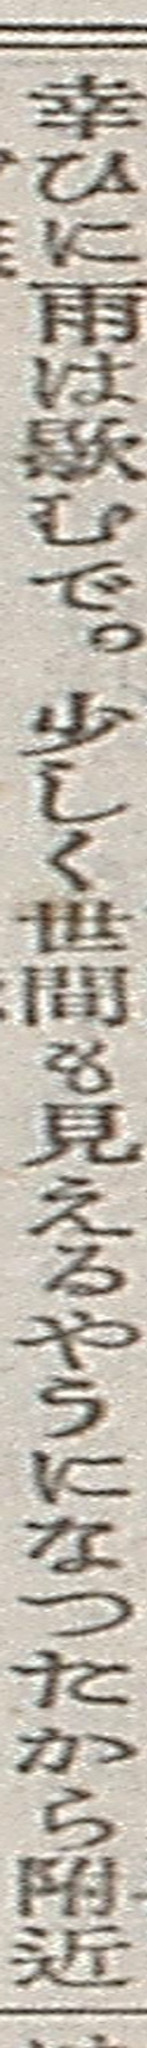幸ひに雨は歇むで。少しく世間も見えるやうになつたから附近
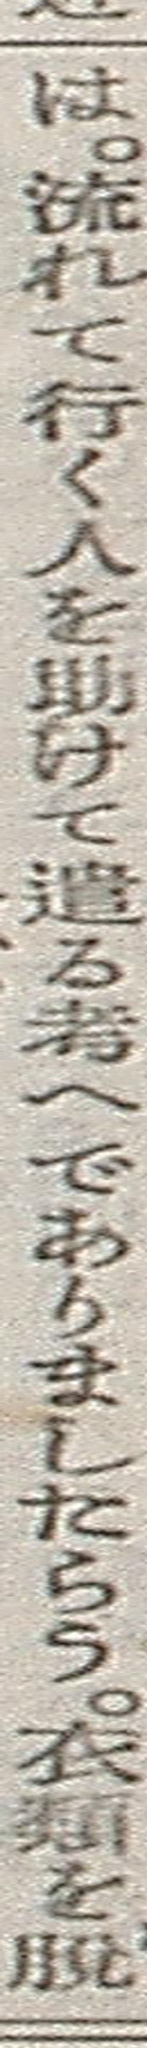は。流れて行く人を助けて遣る考へでありましたらう。衣類を脱
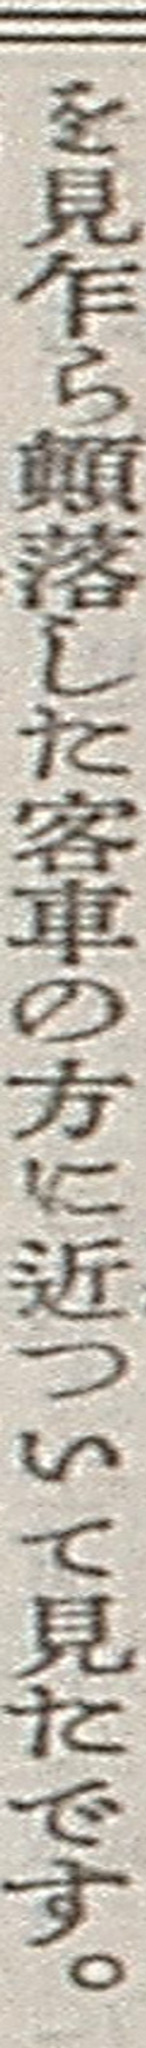を見乍ら顛落した客車の方に近ついて見たです。
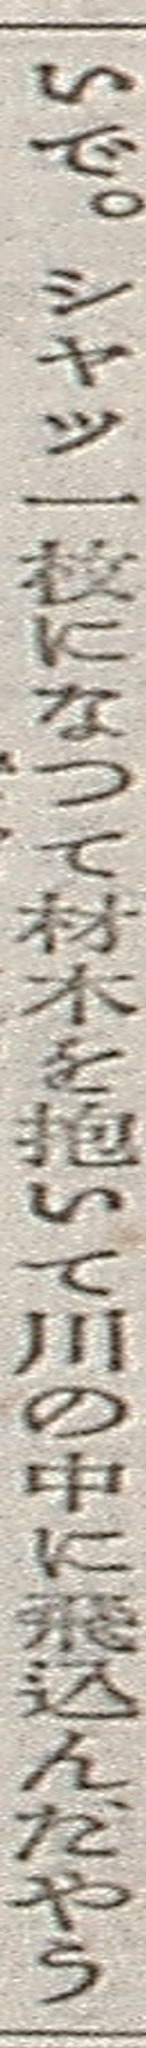いで。シヤツ一枚になつて材木を抱いて川の中に飛込んだやう
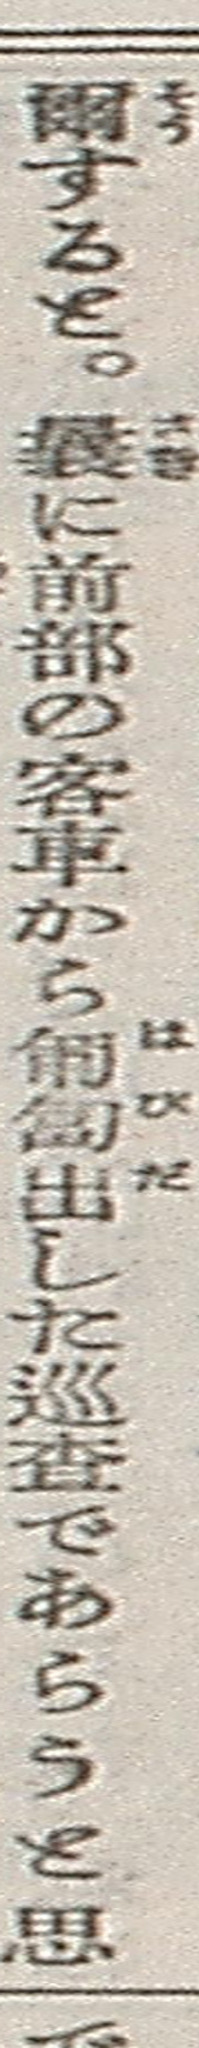爾すると。曩に前部の客車から匍匐出した巡査であらうと思
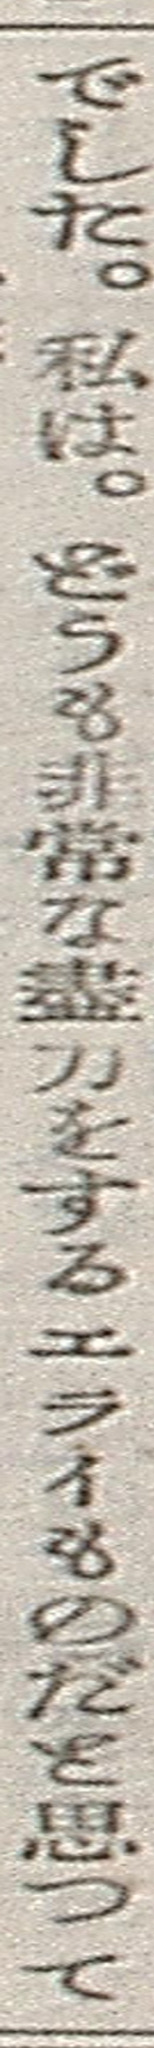でした。私は。どうも非常な尽力をするエライものだと思つて
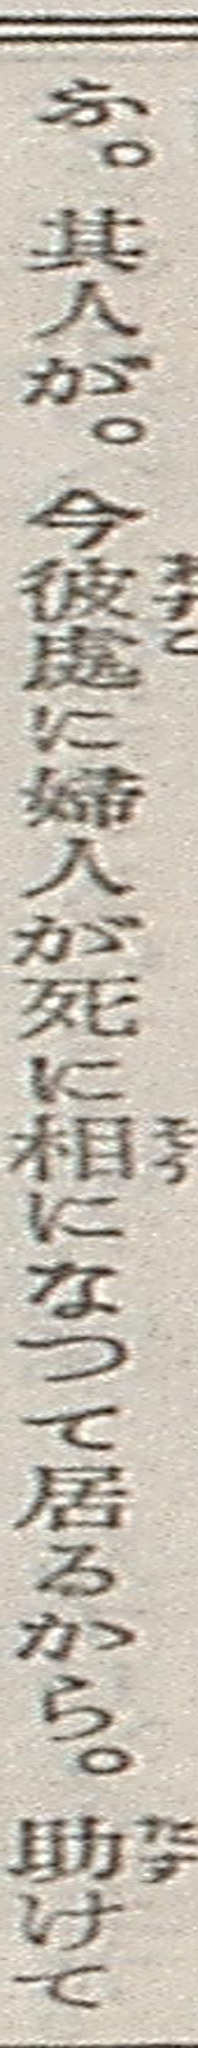ふ。其人が。今彼処に婦人が死に相になつて居るから。助けて
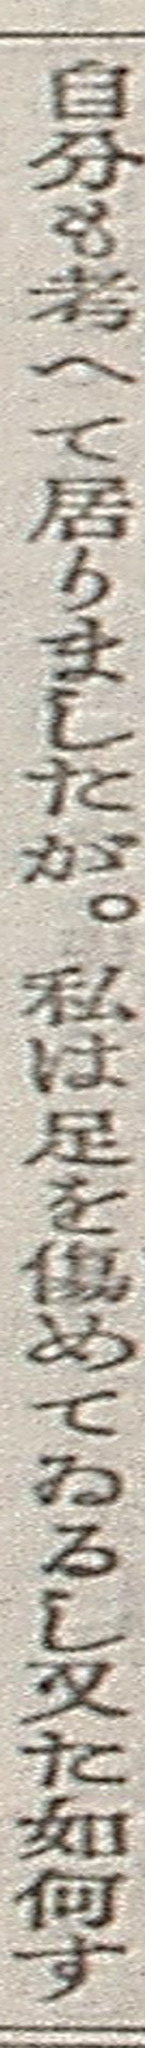自分も考へて居りましたが。私は足を傷めてゐるし又た如何す

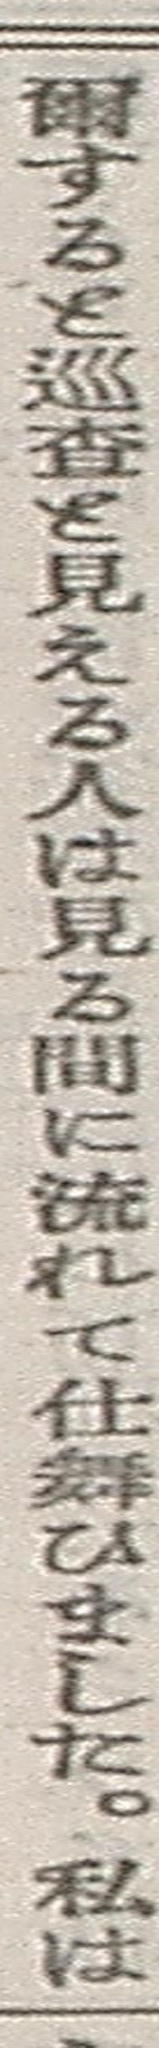爾すると巡査と見える人は見る間に流れて仕舞ひました。私は
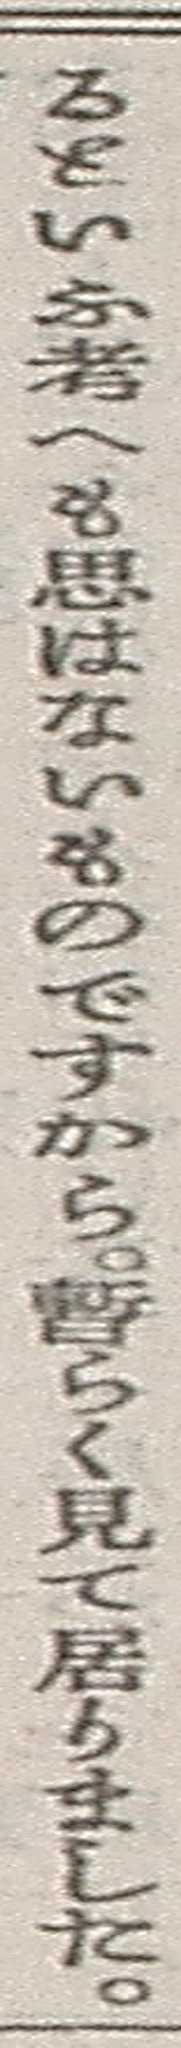るといふ考へも思はないものですから。暫らく見て居りました。
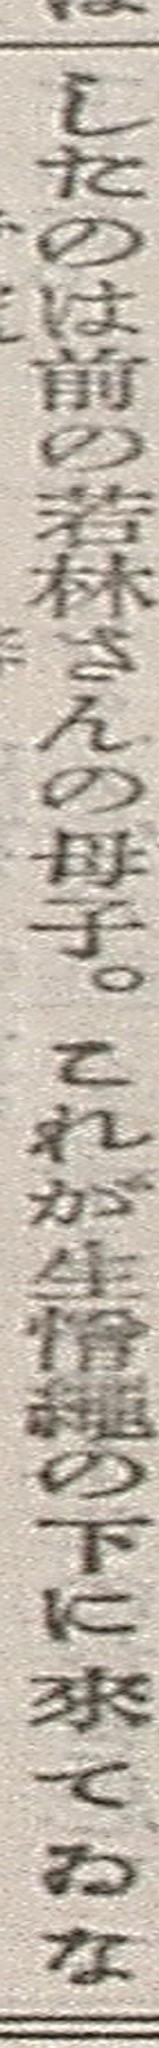したのは前の若林さんの母子。これが生憎縄の下に来てゐな
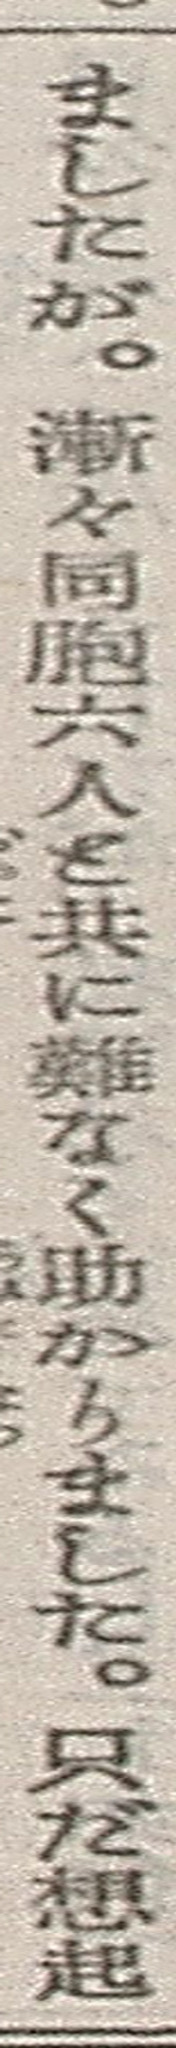ましたが。漸々同胞六人と共に難なく助かりました。只だ想起
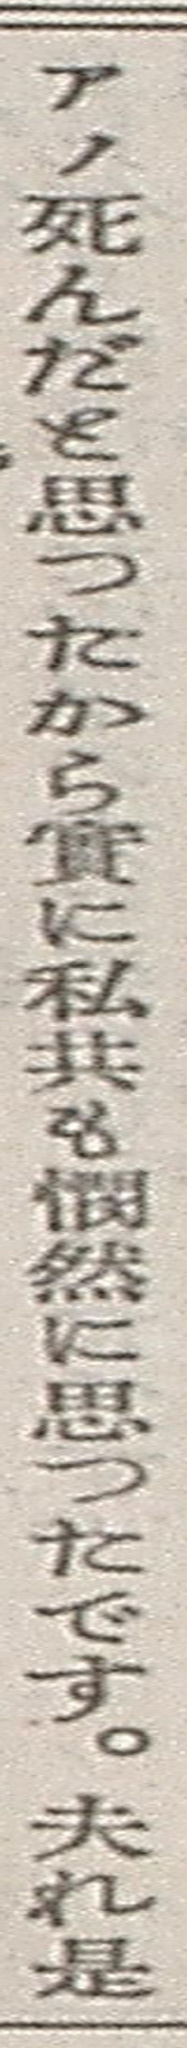アノ死んだと思つたから実に私共も憫然に思つたです。夫れ是
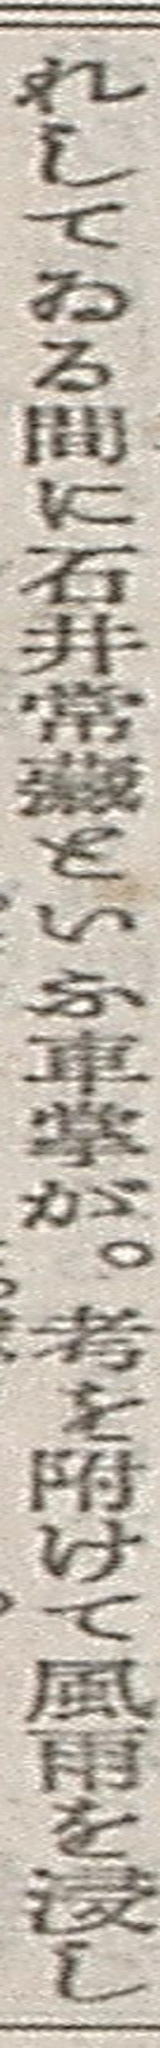れしてゐる間に石井常蔵といふ車掌が。考を附けて風雨を浸し
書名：風俗畫報臨時増刊第百九十九號　明治三十二年十月各地災害圖會（前編之續）
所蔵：東京大学地震研究所図書室 Earthquake Research Institute Library, The University of Tokyo, JAPAN
